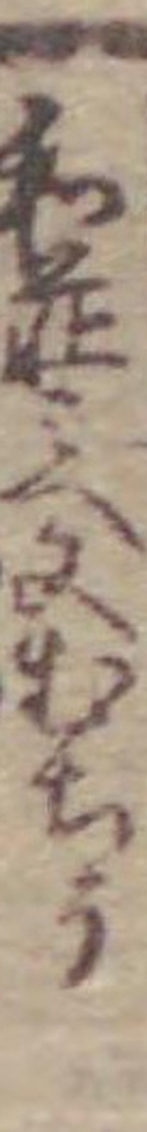和荘兵へ又むちう
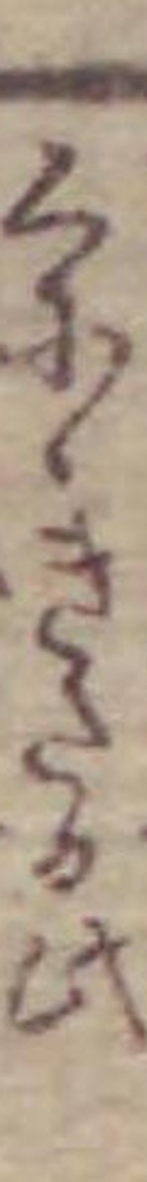くにゝきたるを
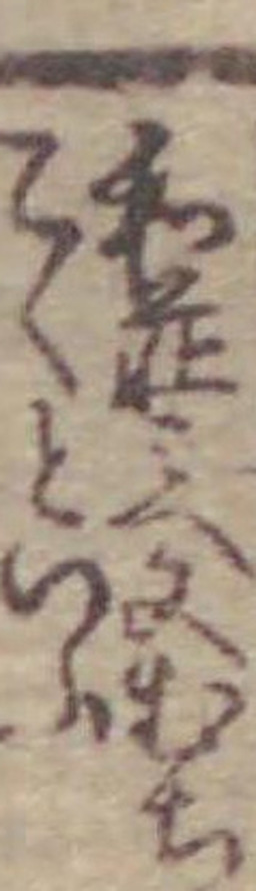こくといふ
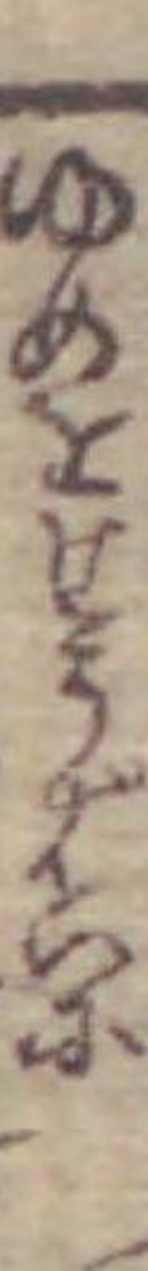ゆめをせうばいに
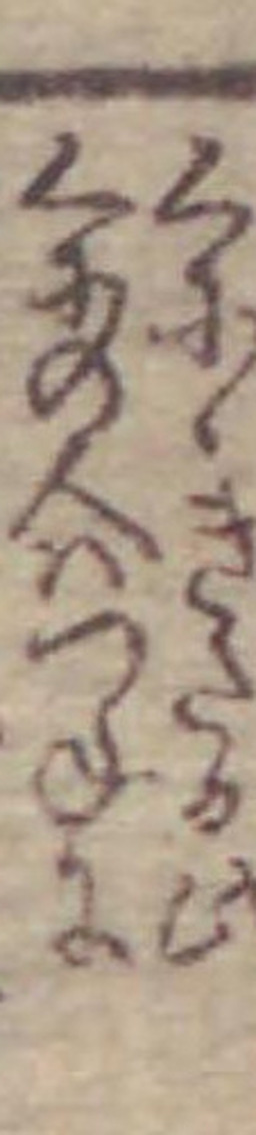くにの人はつねに
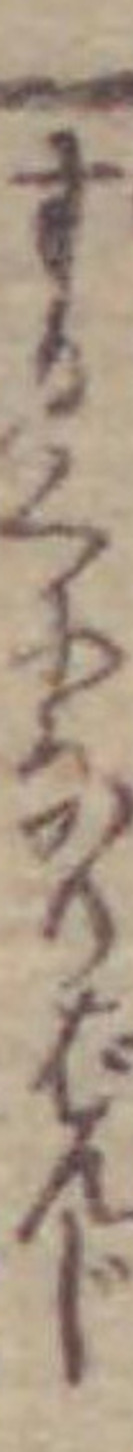するくになりばんじ
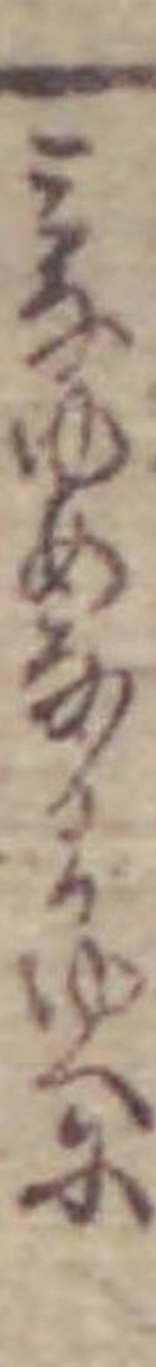みなゆめなるがゆへに
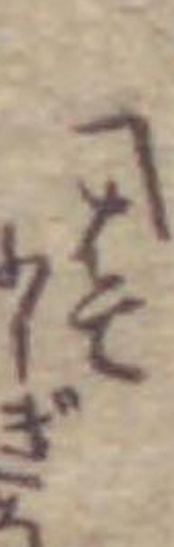〽はて
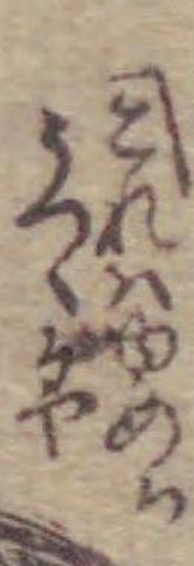〽これはゆめか
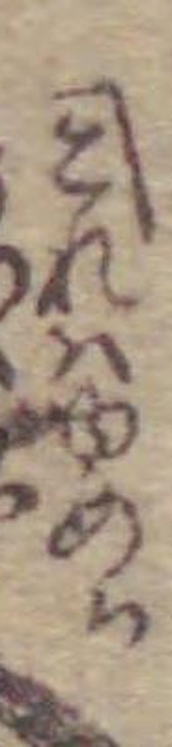〽これはゆめか
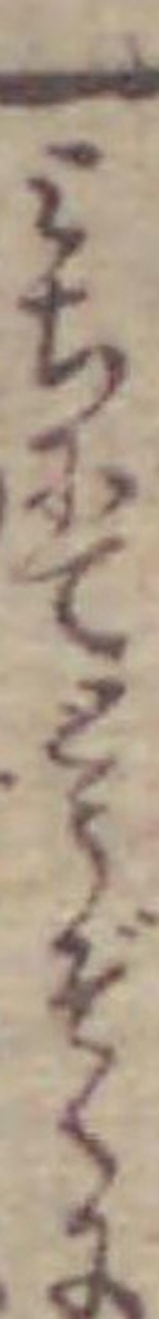みちにてとうぞくに
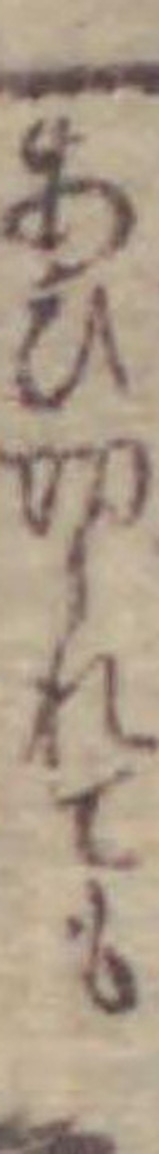あひ切られても
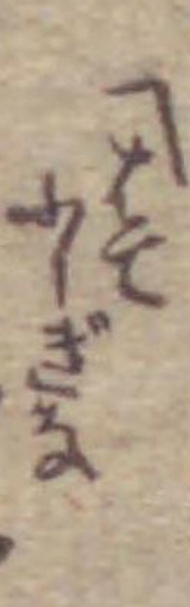〽はて
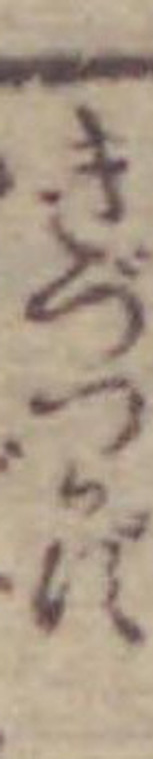きづつかず
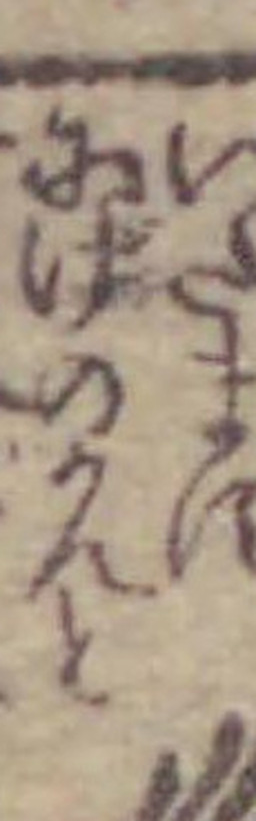にげのかんと
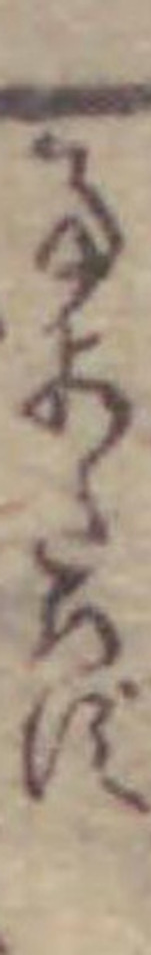事あたはず
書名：和荘兵衛後日話 : 3巻
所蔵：国立国会図書館 National Diet Library, JAPAN
